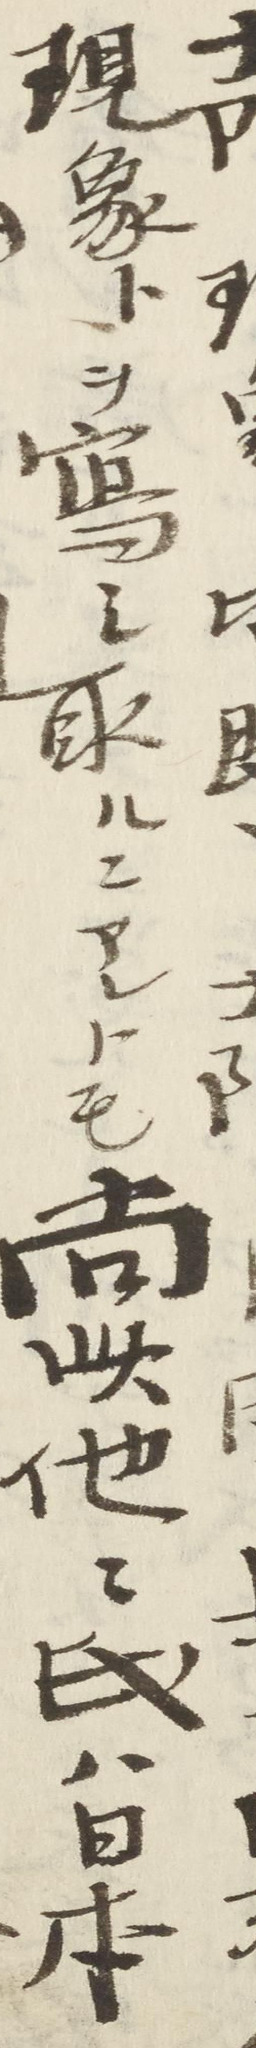現象トヲ写シ取ルニアレトモ尚此他ニ氏ハ日本
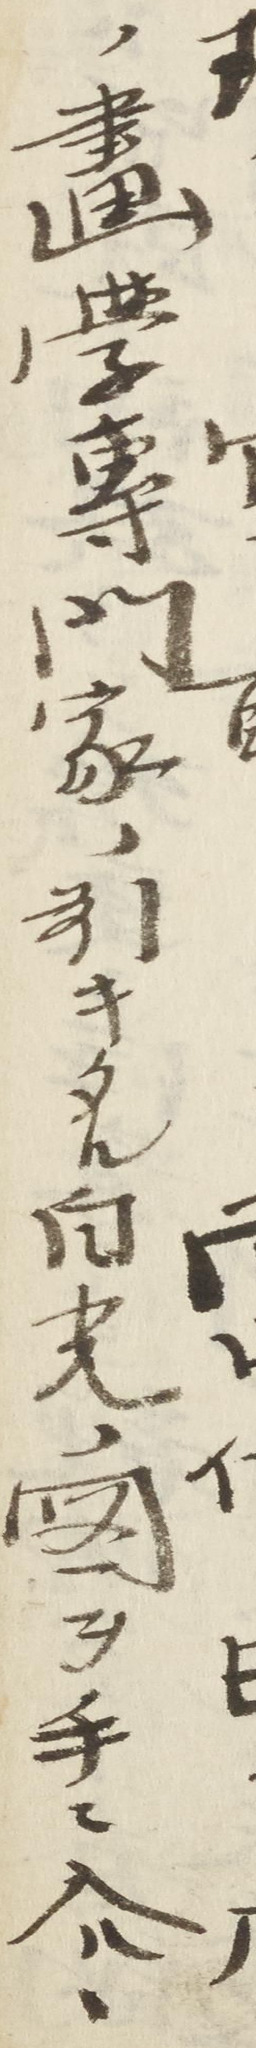ノ画学専門家ノ引キタル白光ノ図ヲ手ニ入ルヽ

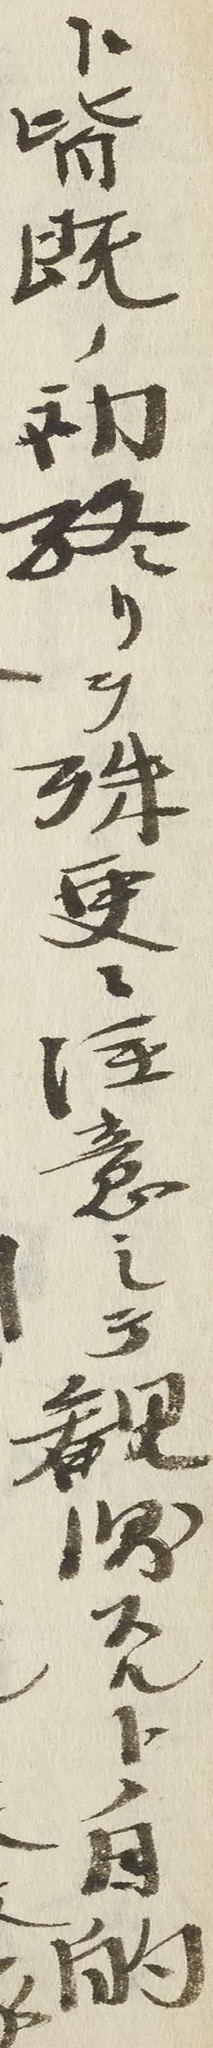ト皆既ノ初終リヲ殊更ニ注意シテ観測スルトノ目的
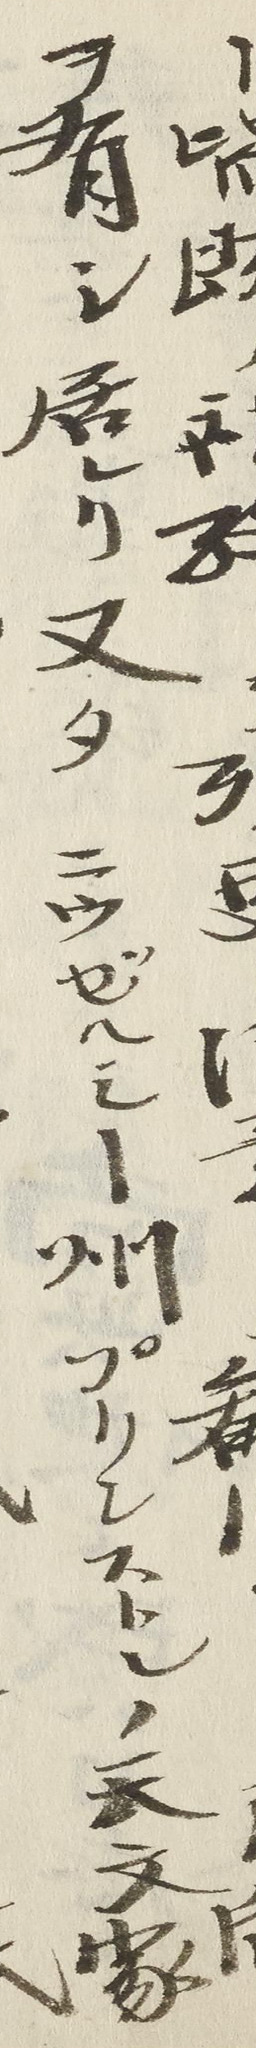ヲ有シ居レリ又タニウゼルシー州プリンストンノ天文家
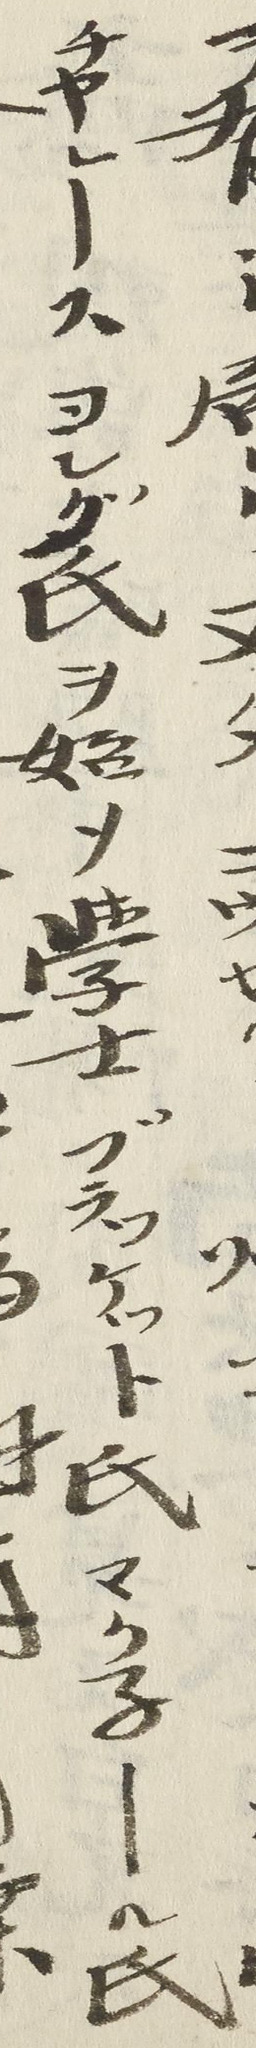チャレースヨング氏ヲ始メ学士ブラッケット氏マウ子―ル氏
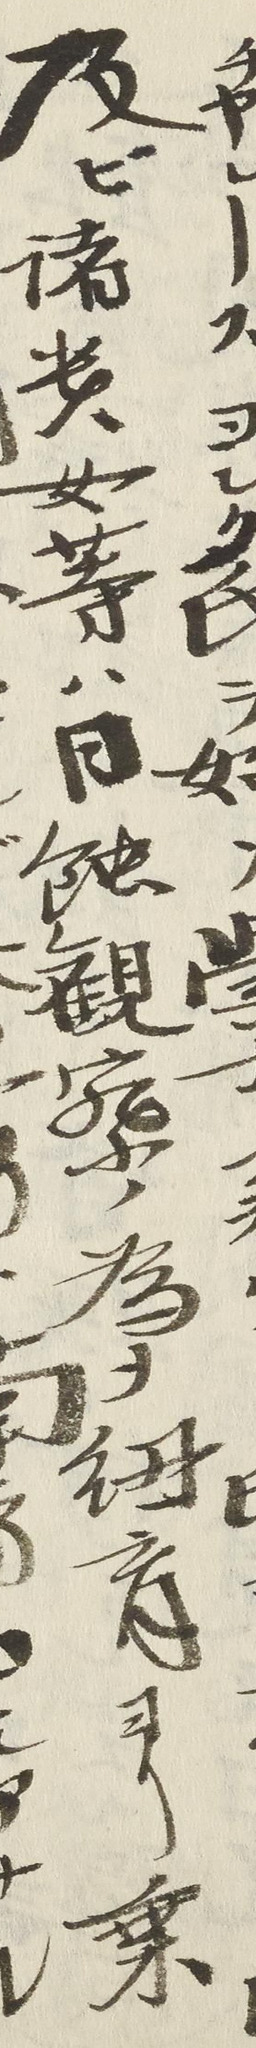及ビ諸貴女等ハ日蝕観察ノ為メ紐育ヨリ乗
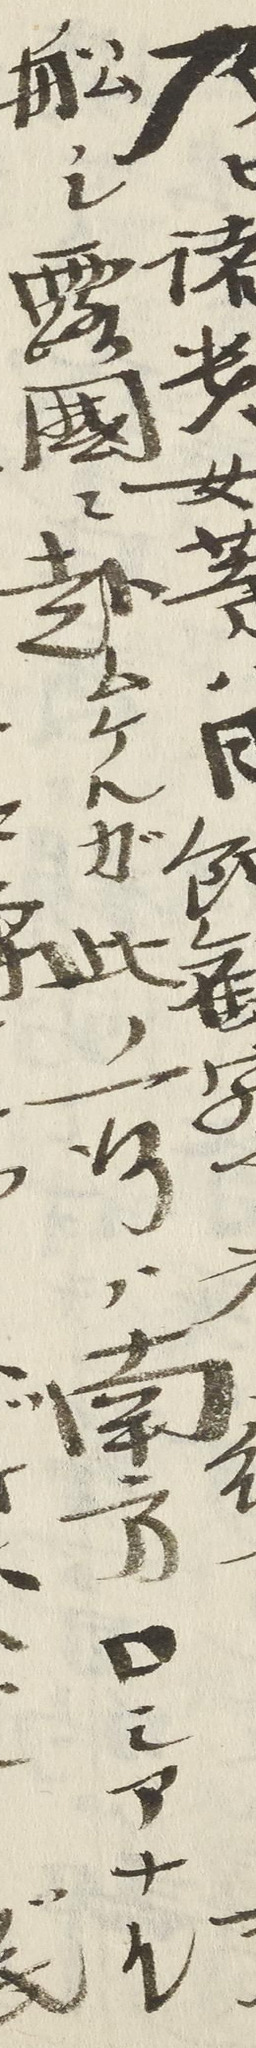船露国ニ赴ムケルガ此ノ一行ハ南方ロシアナル
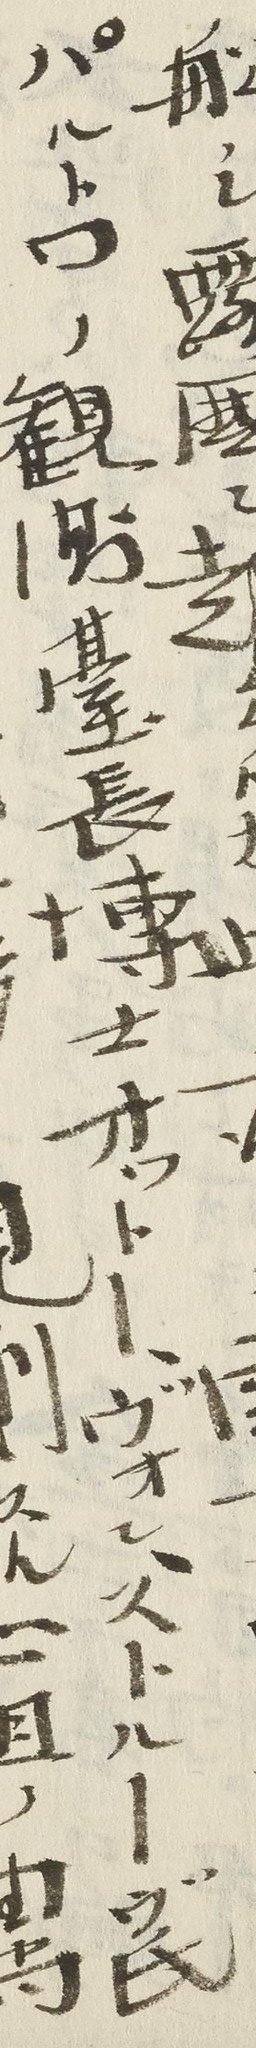パルトロノ観測台長博士オットー、ヴォン、ストルーヴ氏
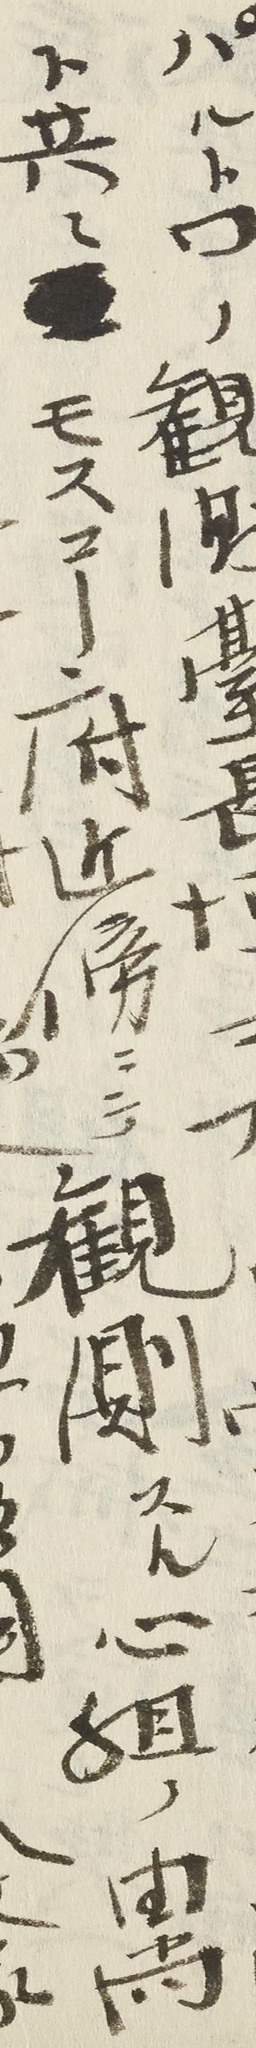ト共ニモスコー府近傍ニテ観測スル心組ノ由尚
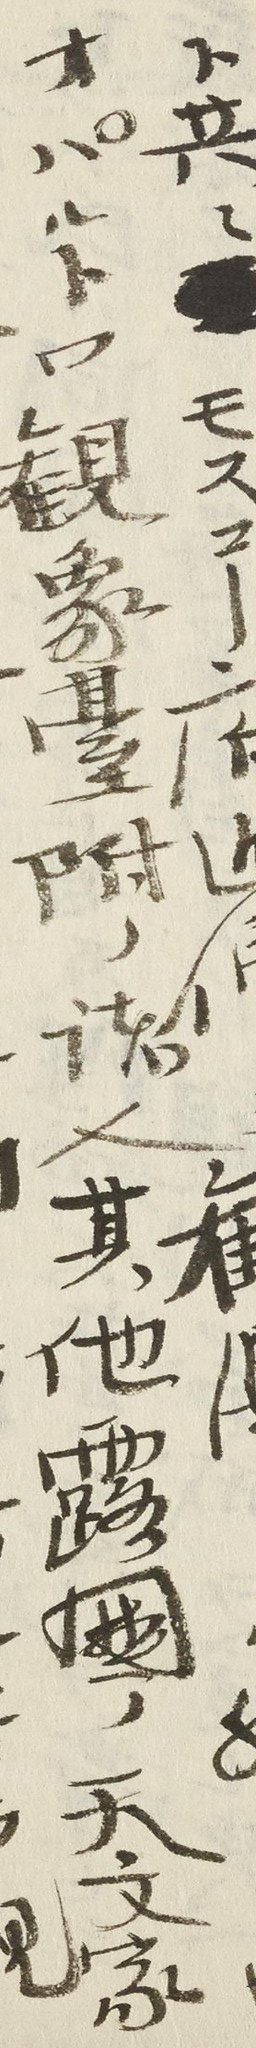ォパルトロ観象台附ノ諸人其ノ他露国ノ天文家
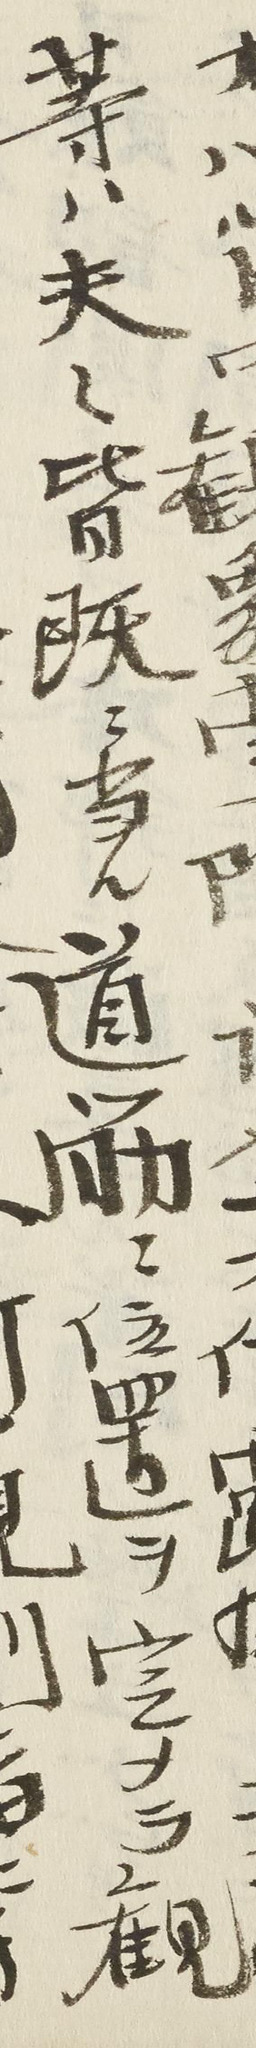等ハ夫々皆既ニ当ル道筋ニ位置ヲ定メテ観
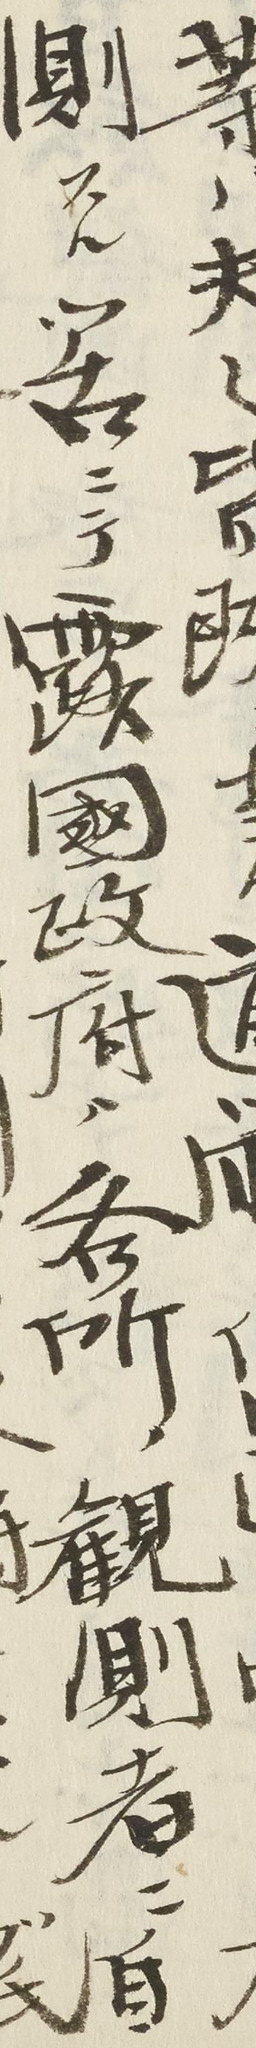測スル筈ニテ露国政府ノ各所ノ観測者ニ自
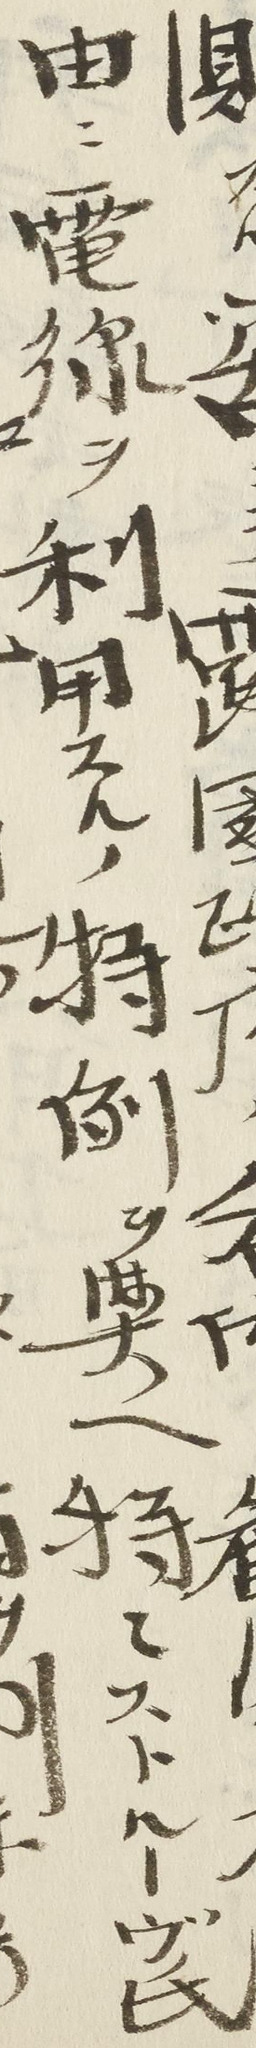由ニ電線ヲ利用スルノ特例ヲ与ヘ特ニストルーヴ氏
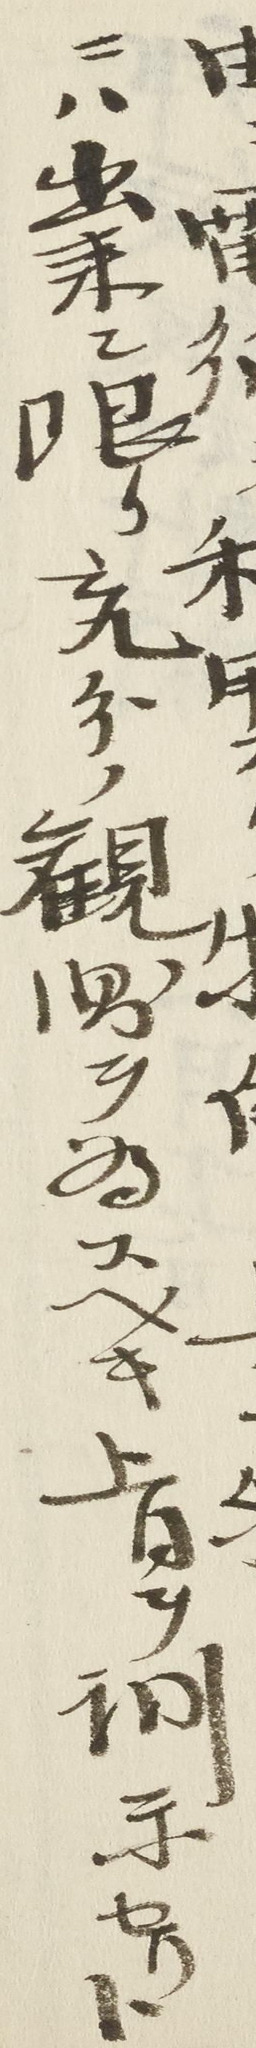ニハ出来ル限リ充分ノ観測ヲ為スベキ旨ヲ訓示セリト
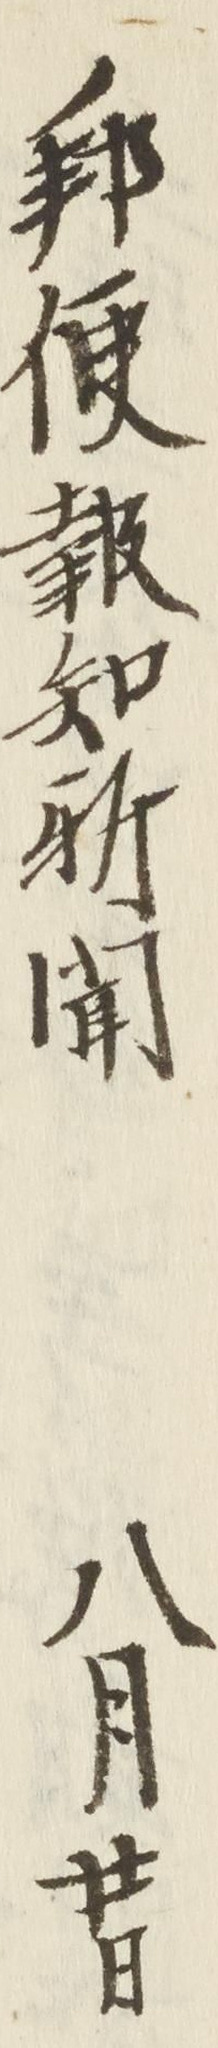郵便報知新聞八月廿日
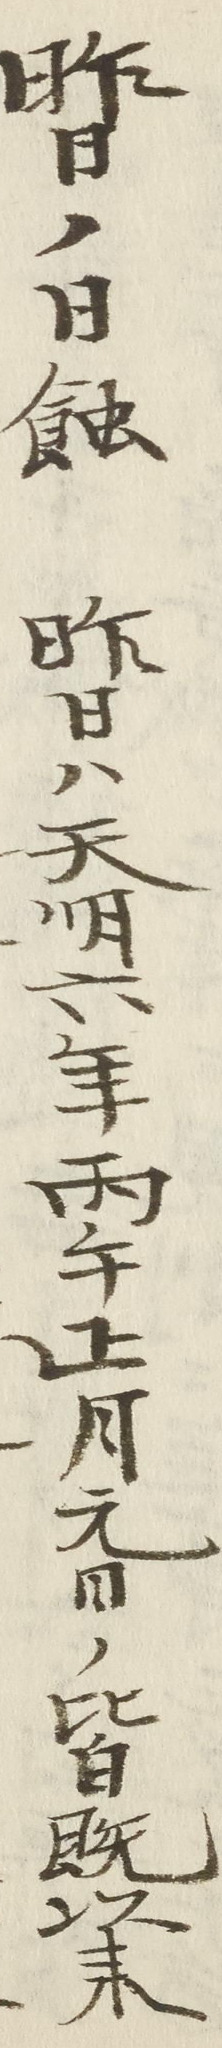昨日ノ日蝕昨日ハ天明六年丙午正月元日ノ皆既以来
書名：日蝕録　全
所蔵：東京大学地震研究所図書室 Earthquake Research Institute Library, The University of Tokyo, JAPAN
